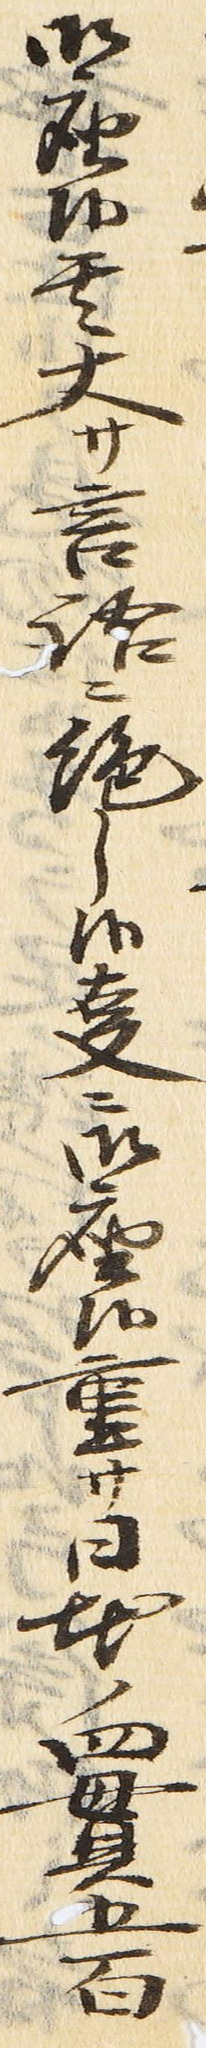御座候其大さ言語に施し候事に御座候重さ日本の四貫五百
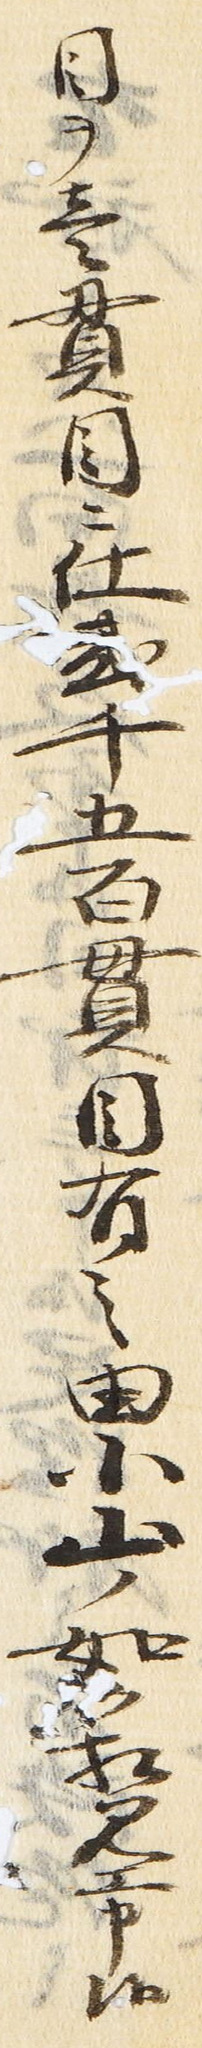目を壱貫目に仕置千五百貫目有之由小山の如く相見え申候
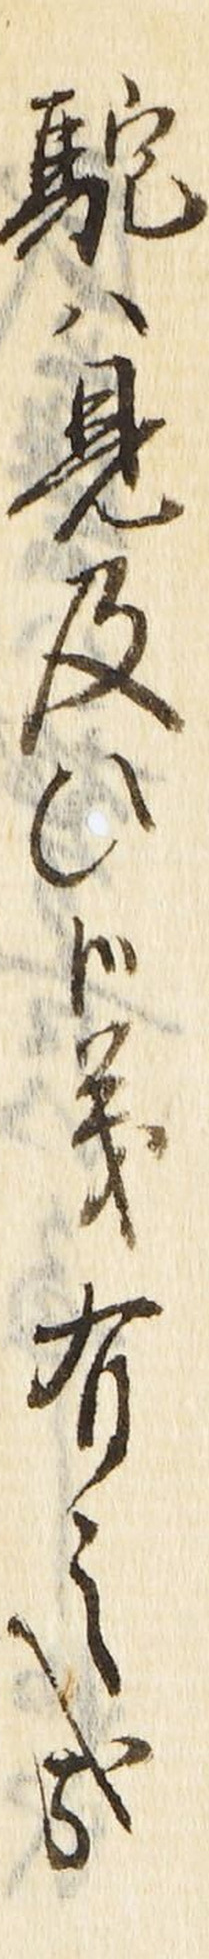駝は見及ひ候義有之哉
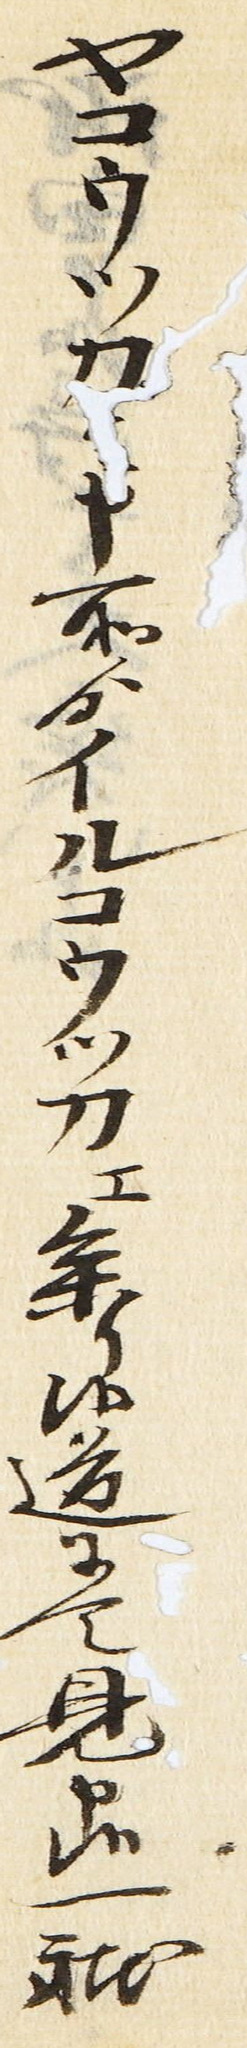ヤコウツカと申所ゟイルコウツカえ参り候道にて見申候一体
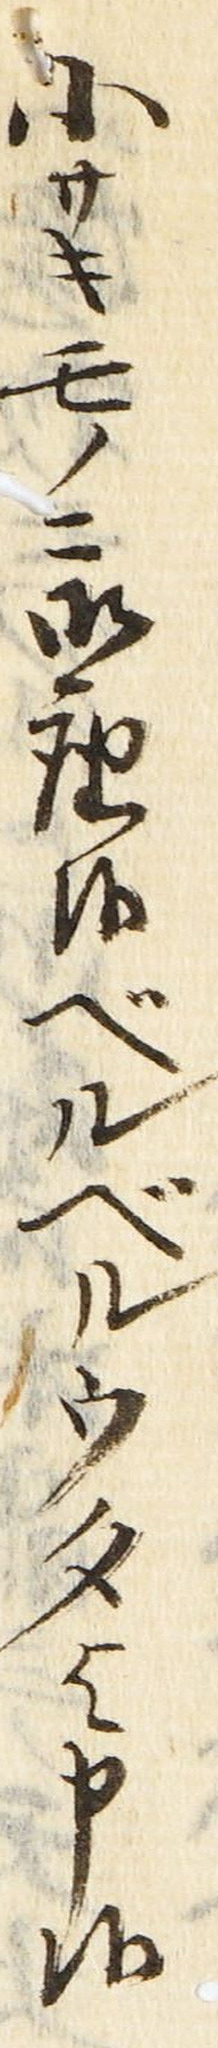小さきものに御座候ベルベルウタと申候
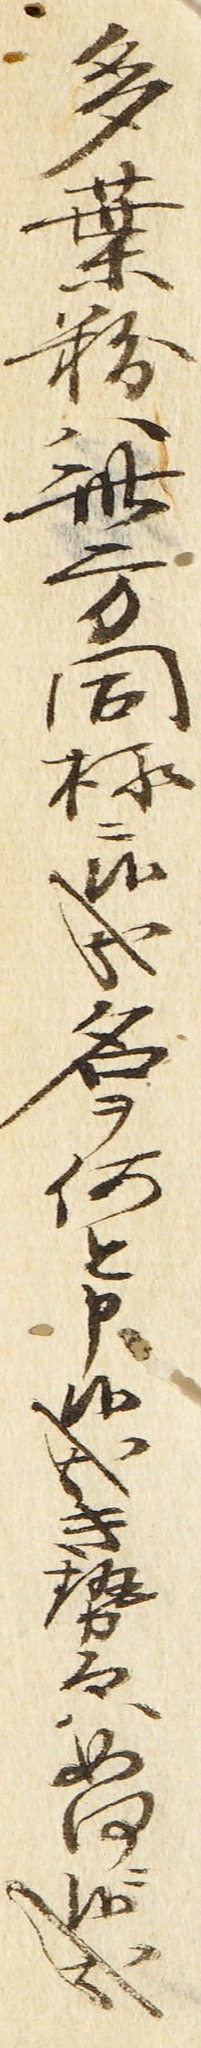多葉粉は此方同様に候哉名を何と申候哉きせるは如何に候哉

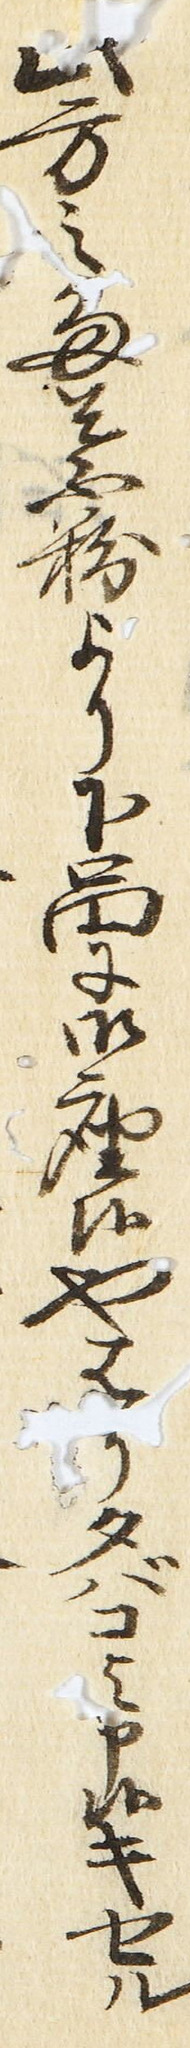此方之多葉粉より下品に御座候やはりタバコと申候キセル
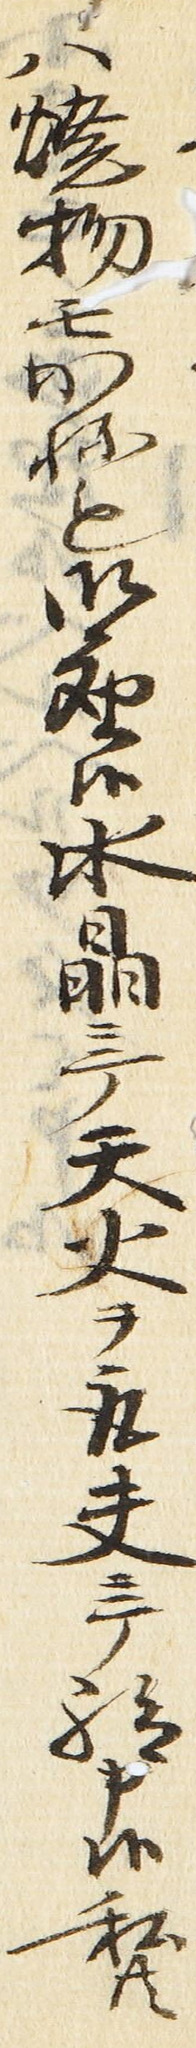は焼物もかねも御座候水晶にて天火を取夫にて給申候私共
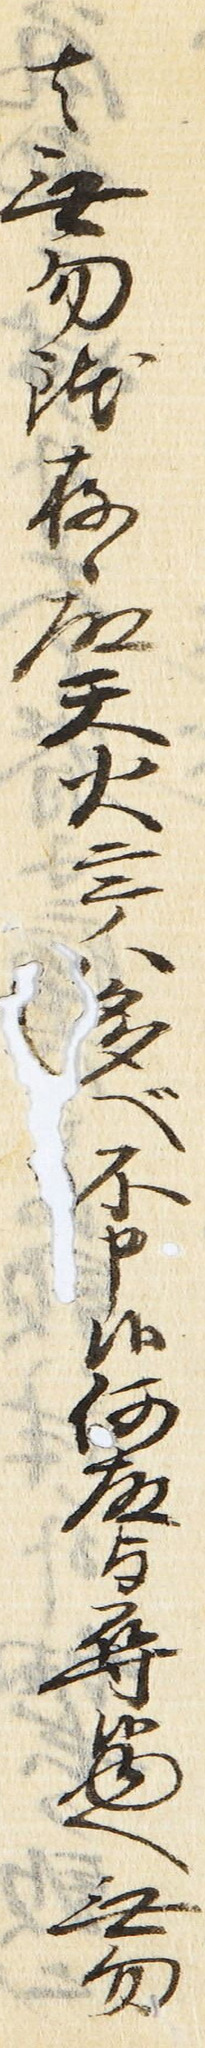は無勿体存候故天火にてはたべ不申何故と尋候ゆへ無勿
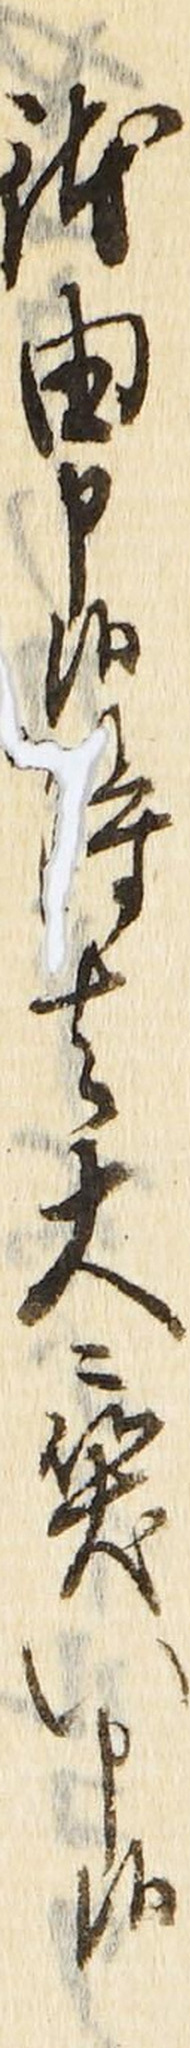体由申候得は大に笑い申候
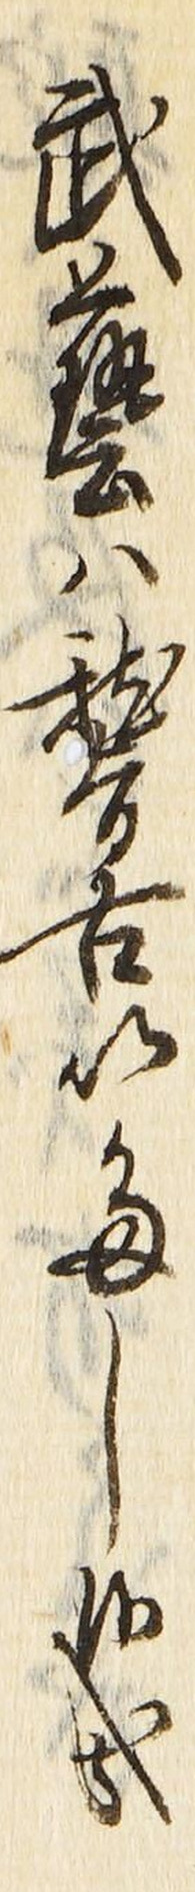武芸は稽古いたし候哉
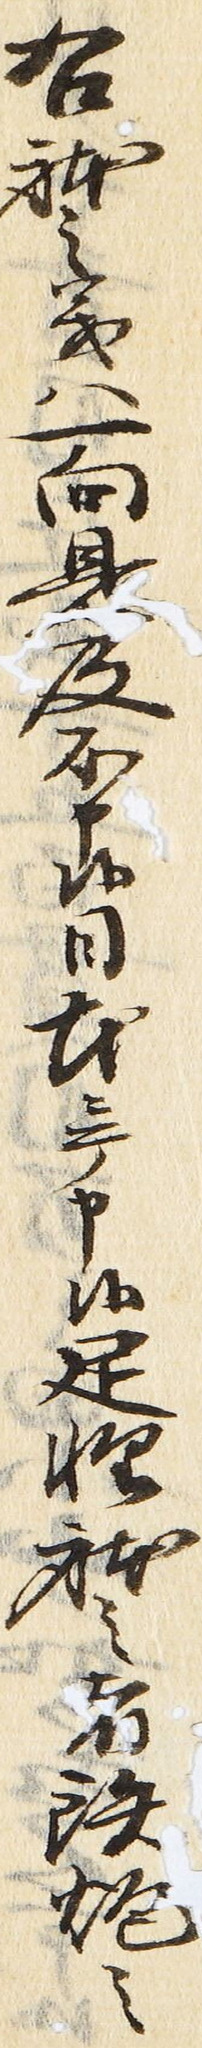右体の義は一向見及不申候日本にて申候足軽体之者鉄砲之
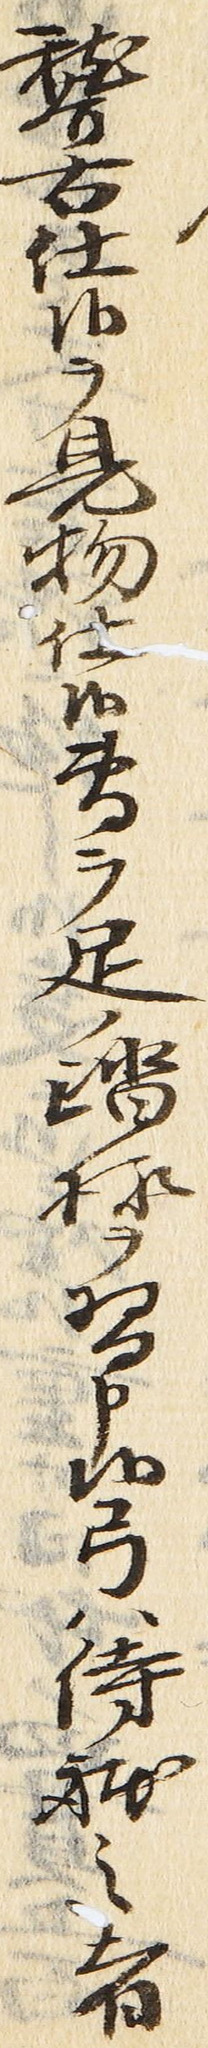稽古仕候を見物仕候専ら足の踏様を習申候弓は侍体之者
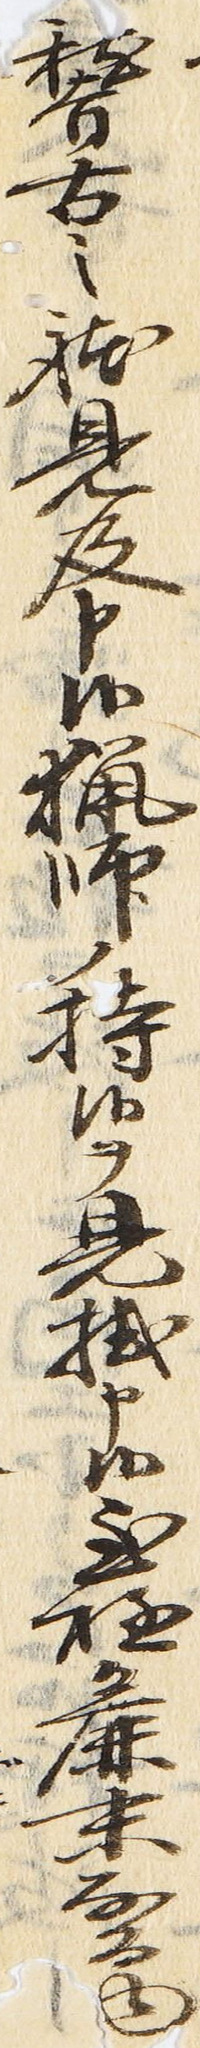稽古之体見及申候猟師の持候を見掛申候至極麁末なる物
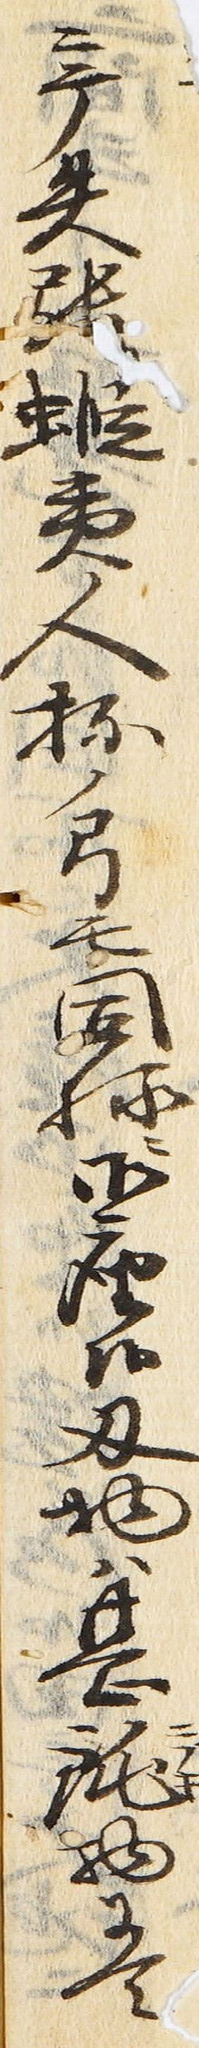にて矢張蝦夷人抔の弓も同様に御座候刃物は甚鈍物にて
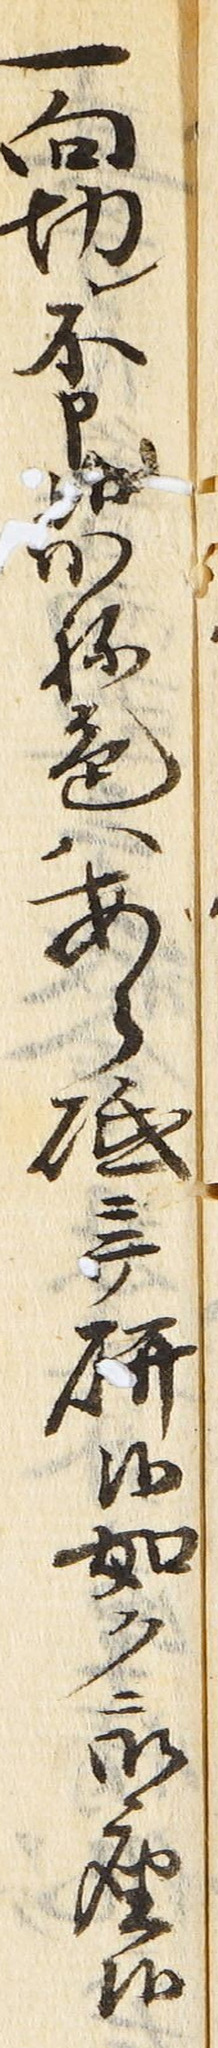一向切れ不申候かね色はあら砥にて研候如くに御座候
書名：神昌丸漂流問答
